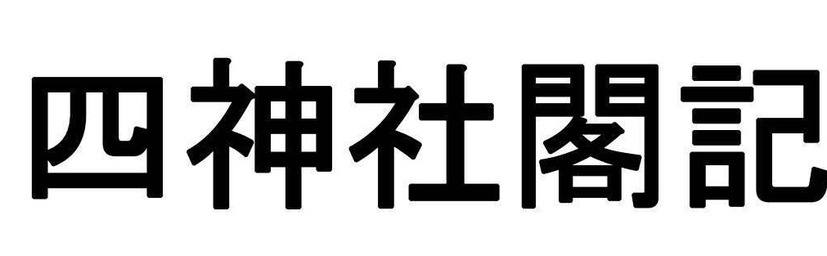四神社閣記

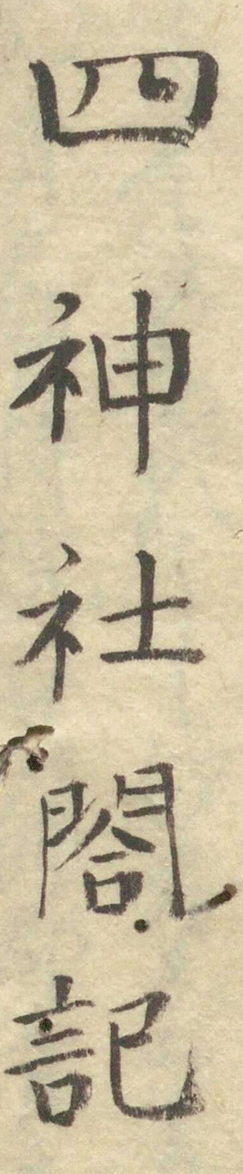四神社閣記

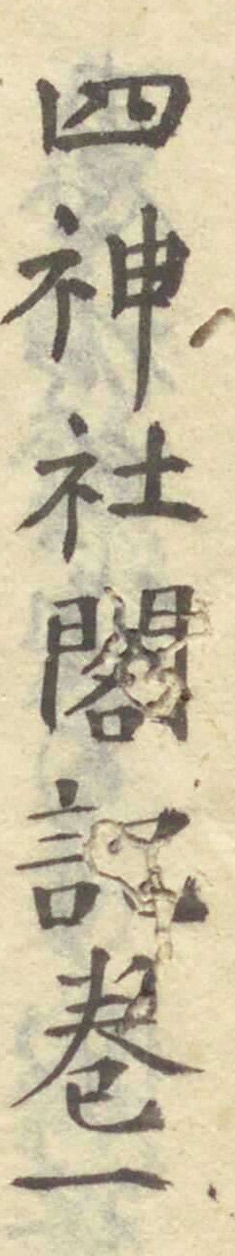四神社閣記巻一
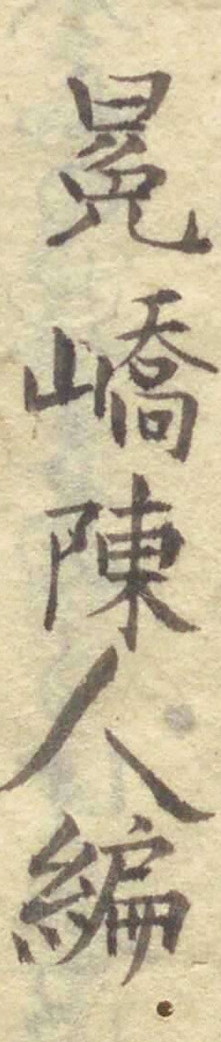冕嶠陳人編
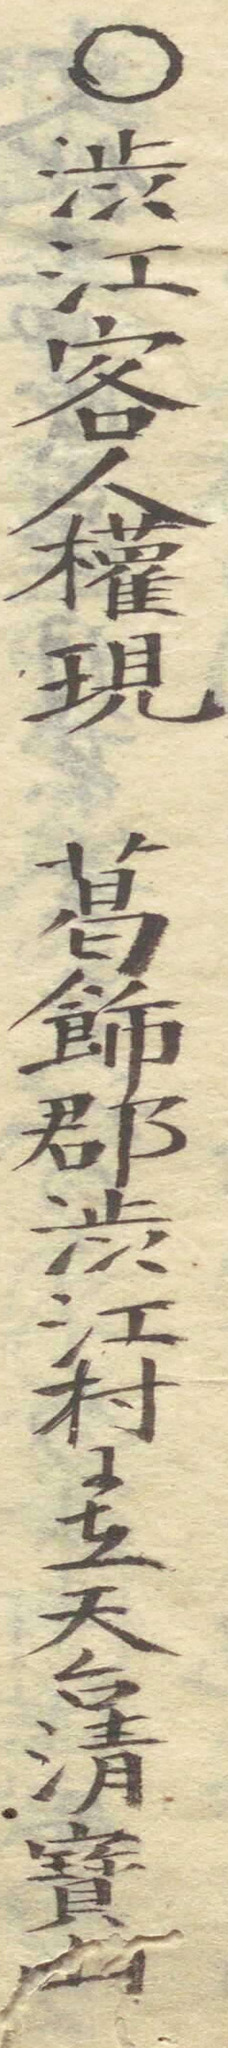○渋江客人権現葛飾郡渋江村に在清宝山
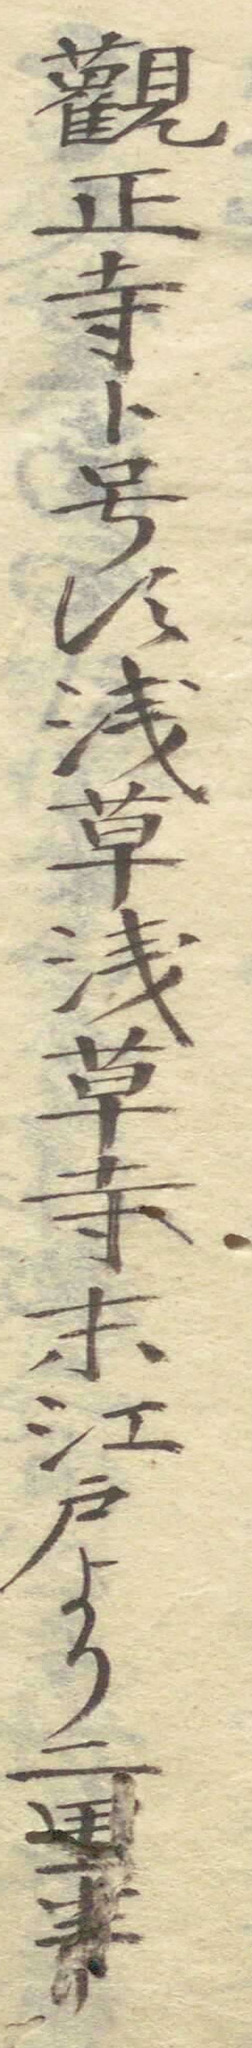観正寺と号す浅草浅草寺末江戸より二里半
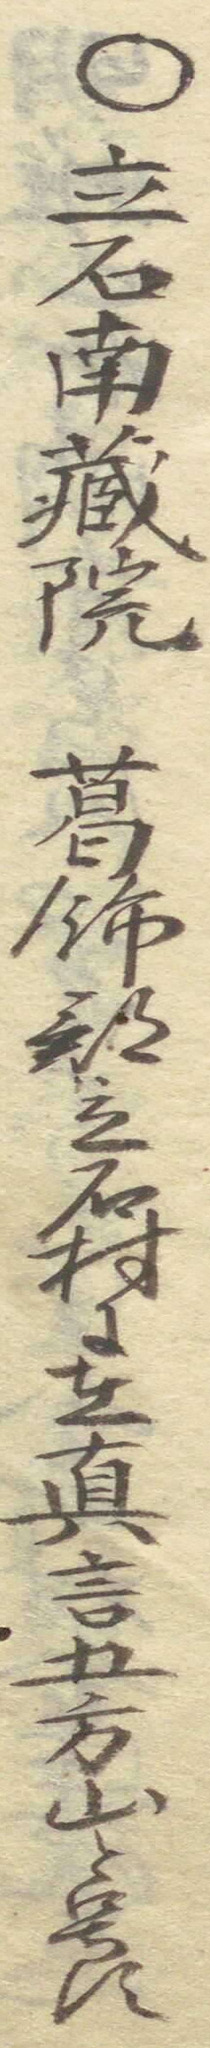○立石南蔵院葛飾郡立石村に在真言五方山と号す
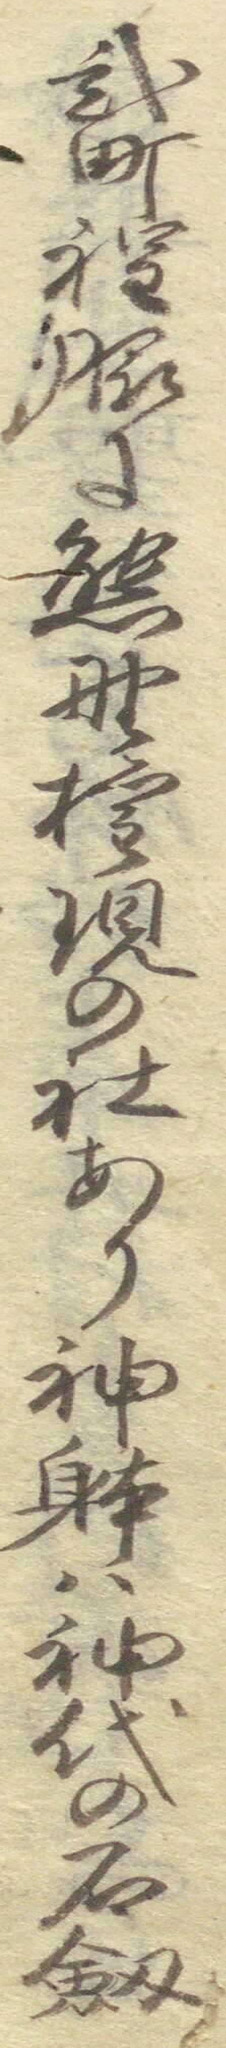弐町程脇に熊野権現の社あり神体は神代の石剣
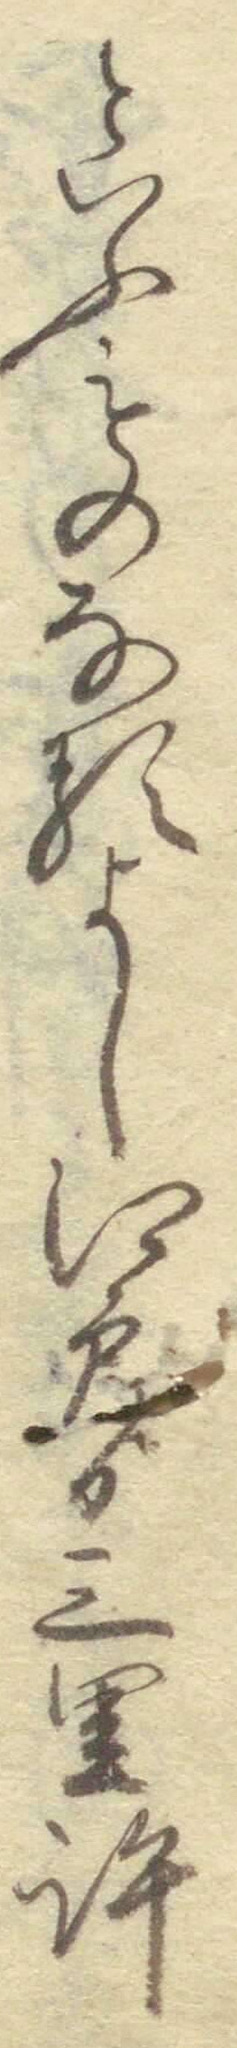といふものなるよし江戸より三里許
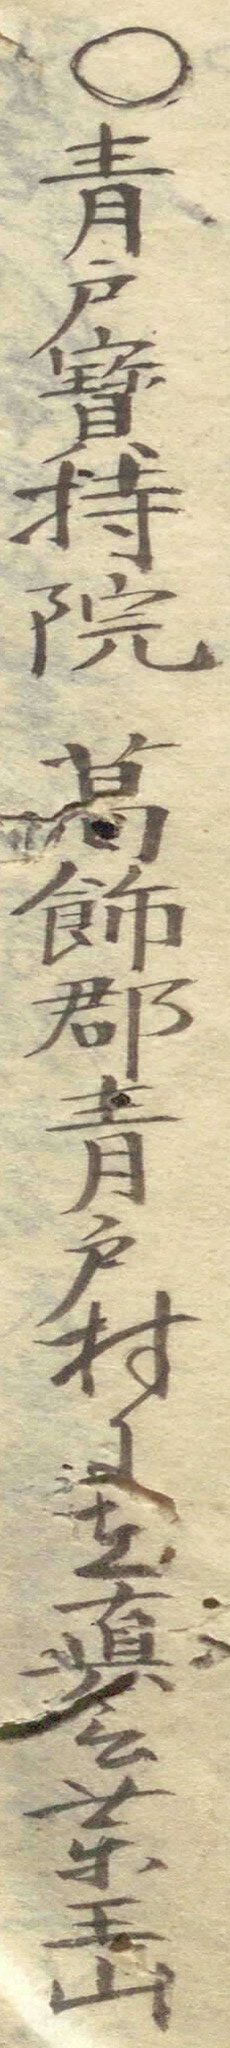○青戸宝持院葛飾郡青戸村に在真言薬王山

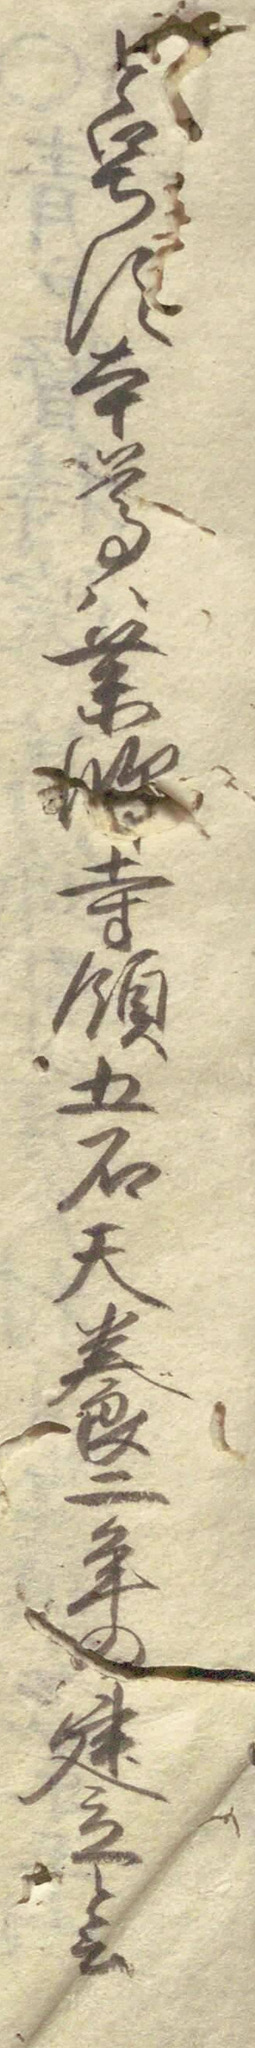と号す本尊は薬師寺領五石天養二年建立と云
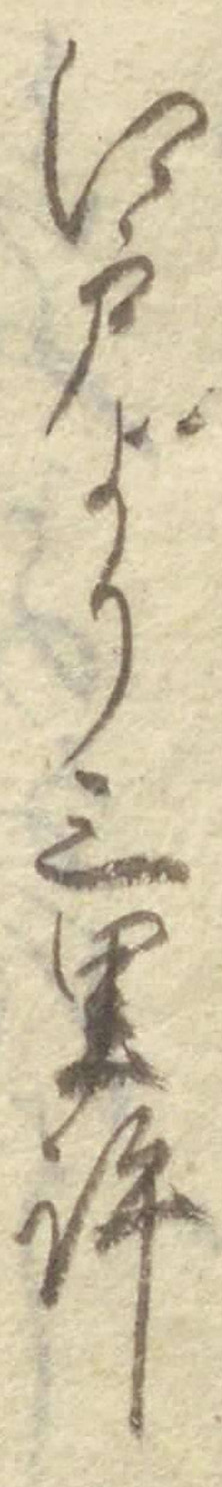江戸より三里許
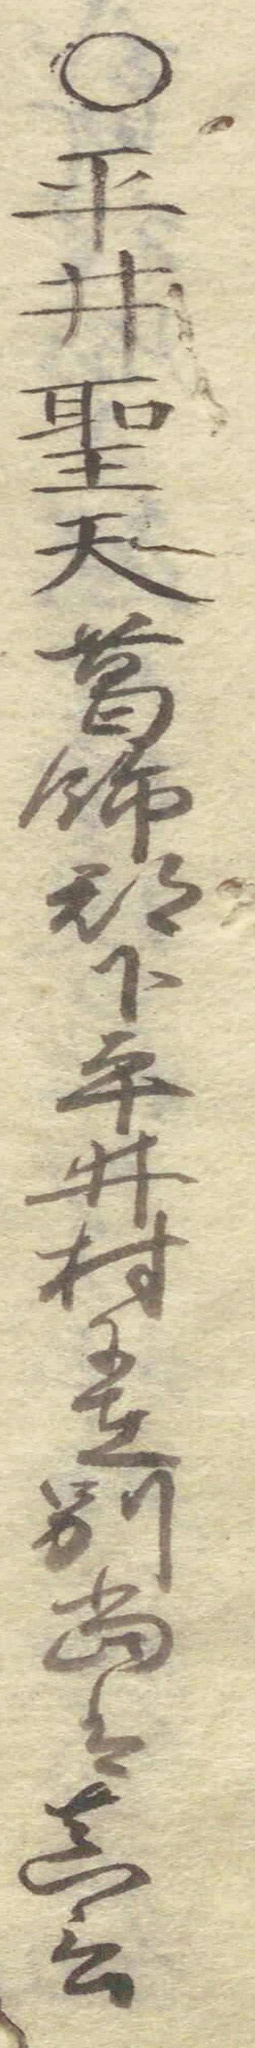○平井聖天葛飾郡下平井村に在別当は真言
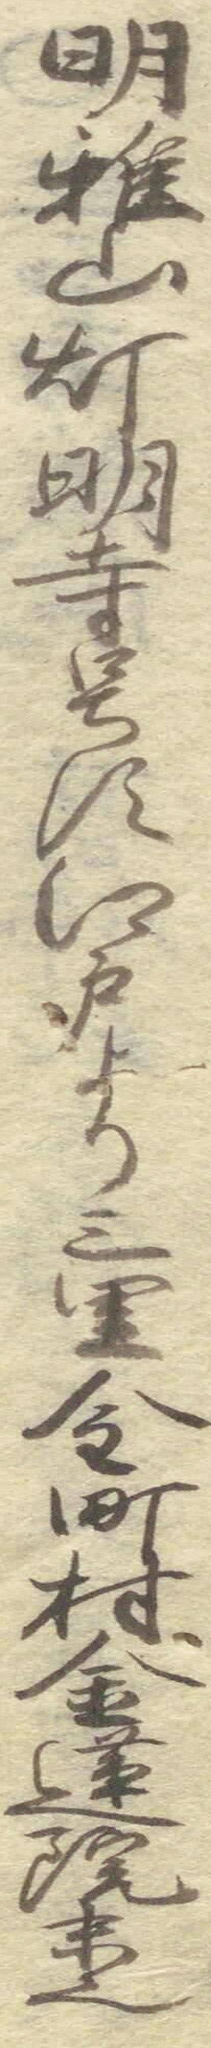明雅山灯明寺号す江戸より三里金町村金蓮院末也
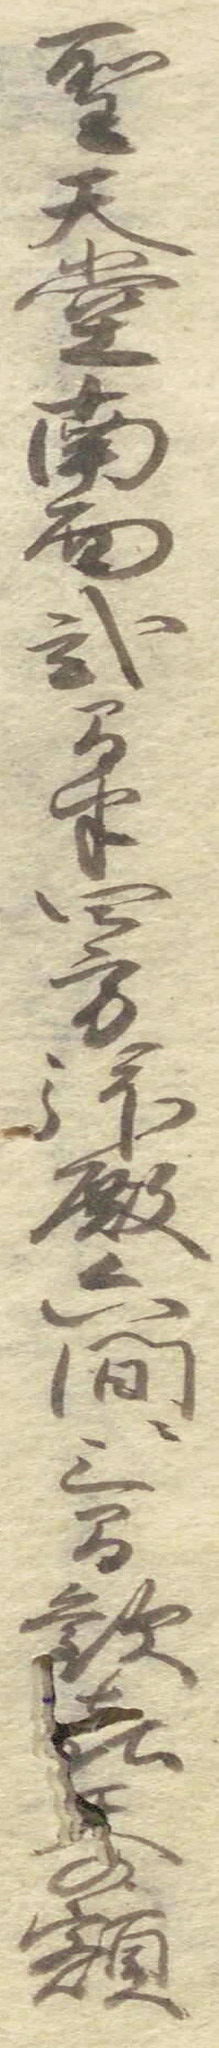聖天堂南面弐間半四方拝殿六間に三間歓喜天の額
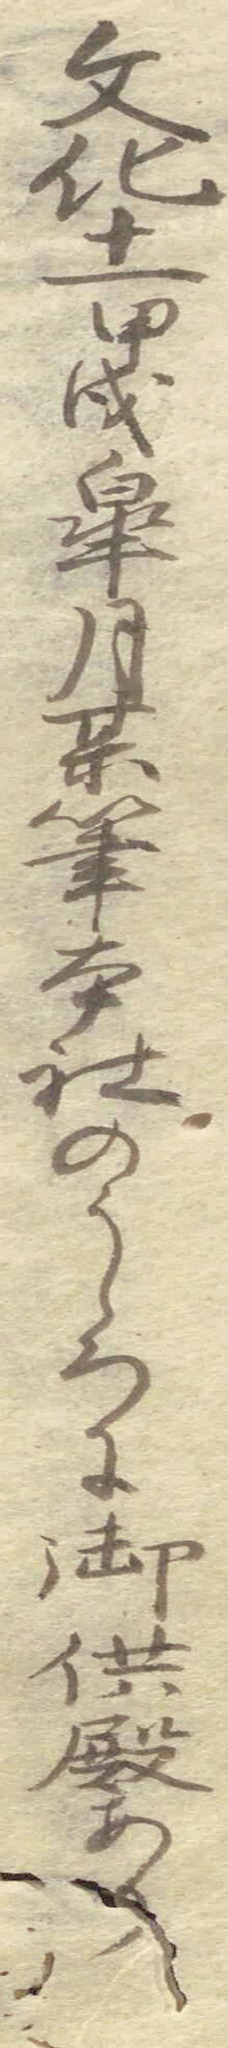文化十一甲戌皐月某筆本社のうしろに御供殿あり
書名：四神社閣記
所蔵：茨城大学附属図書館 国文学研究資料館
